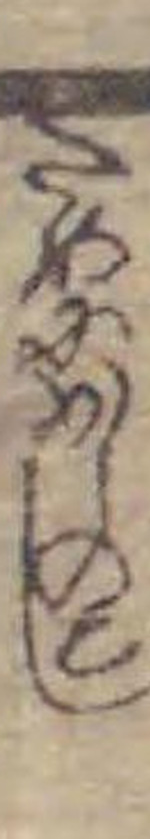ために少しのこし
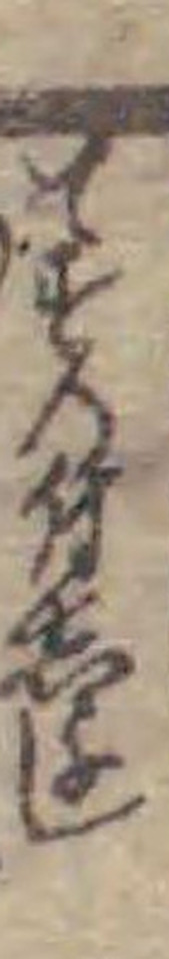てすり付しよし
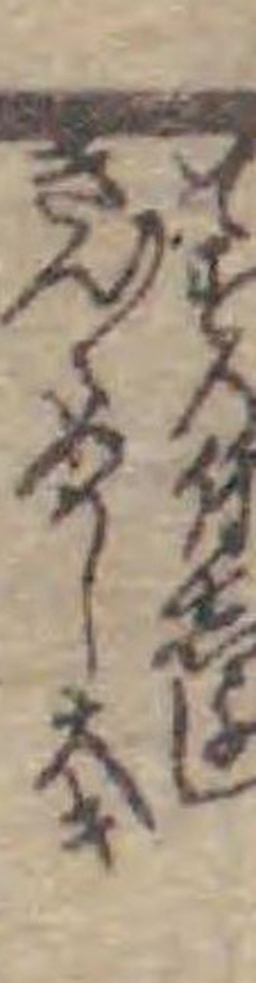きん〳〵めかし大き
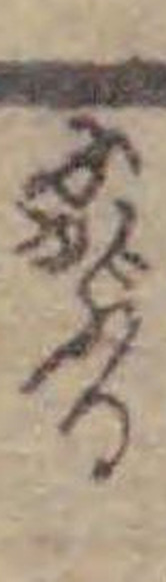にかぶる
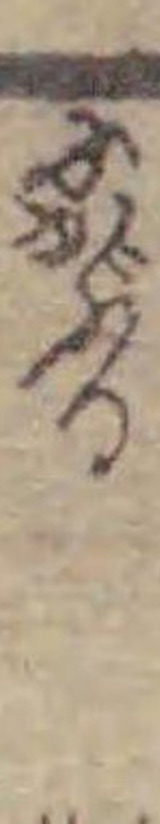にかぶる
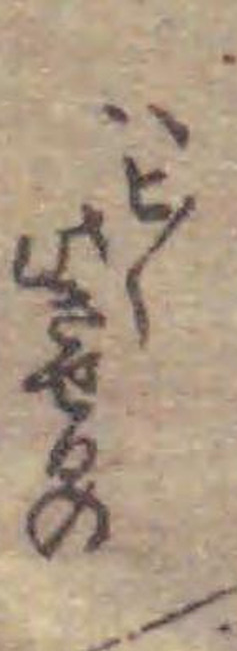此きせるの
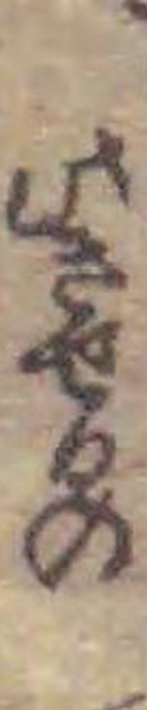此きせるの
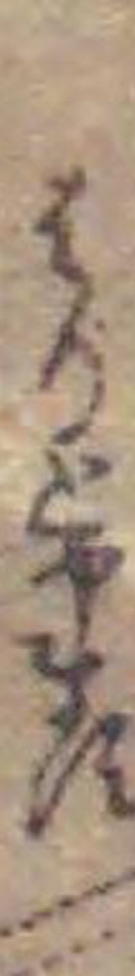はりと申ます
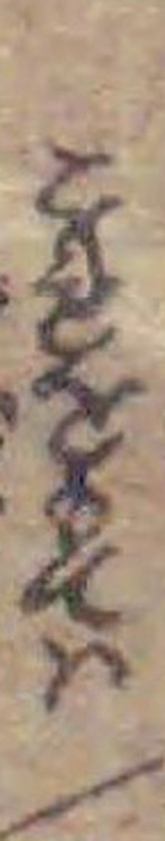これをもては

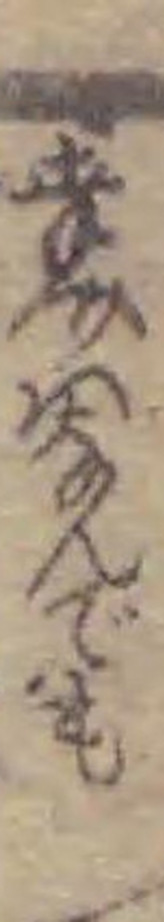幸介はなんでも
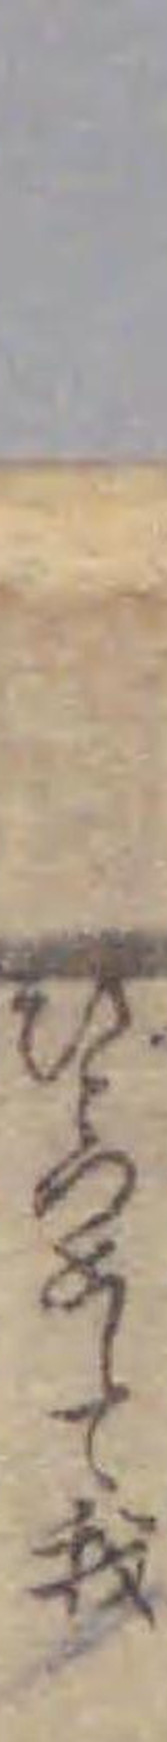ひとつとして我
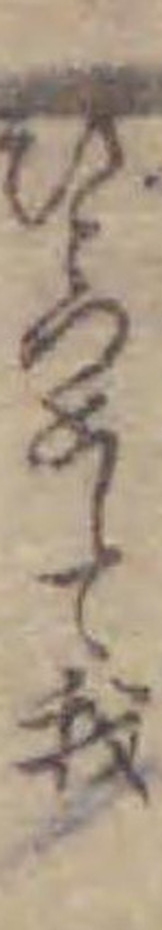ひとつとして我
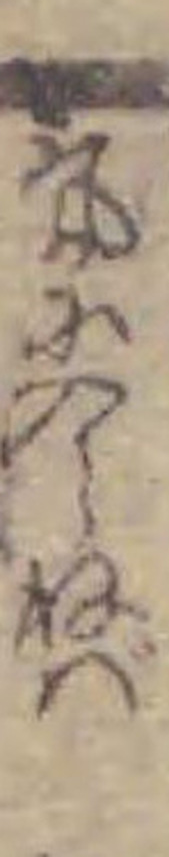気に入らねば
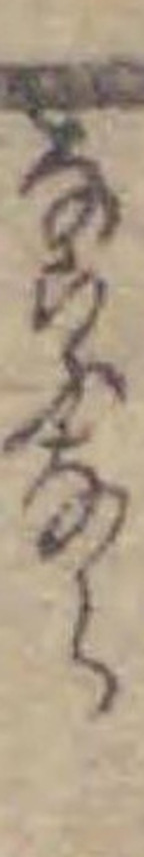ならふなら
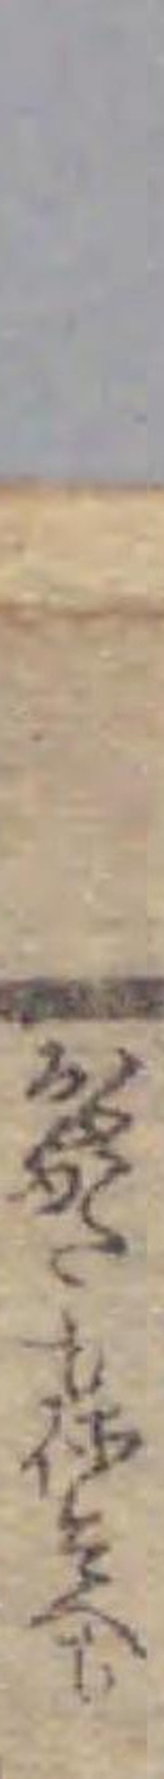おやかたも徳兵へも
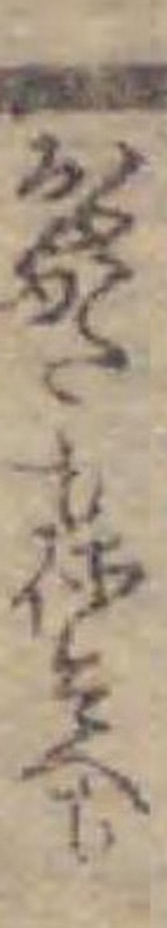おやかたも徳兵へも
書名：通風伊勢物語 : 3巻
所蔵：国立国会図書館 National Diet Library, JAPAN
